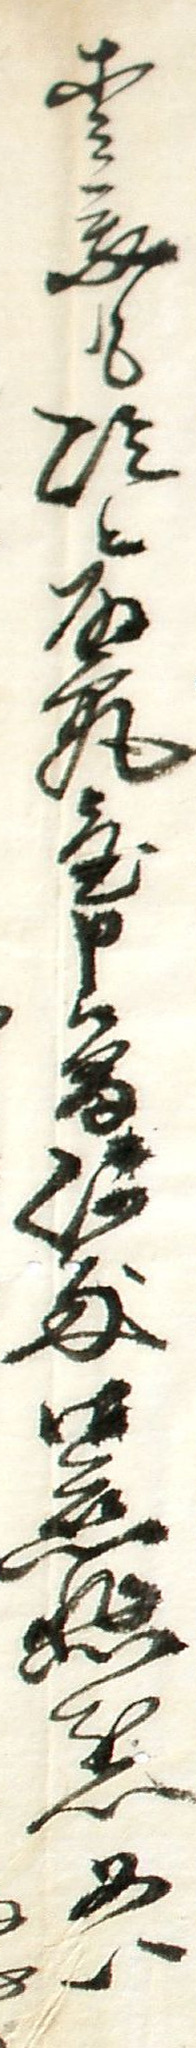等之義も屹と取究置申候間何卒御慈悲を以て右
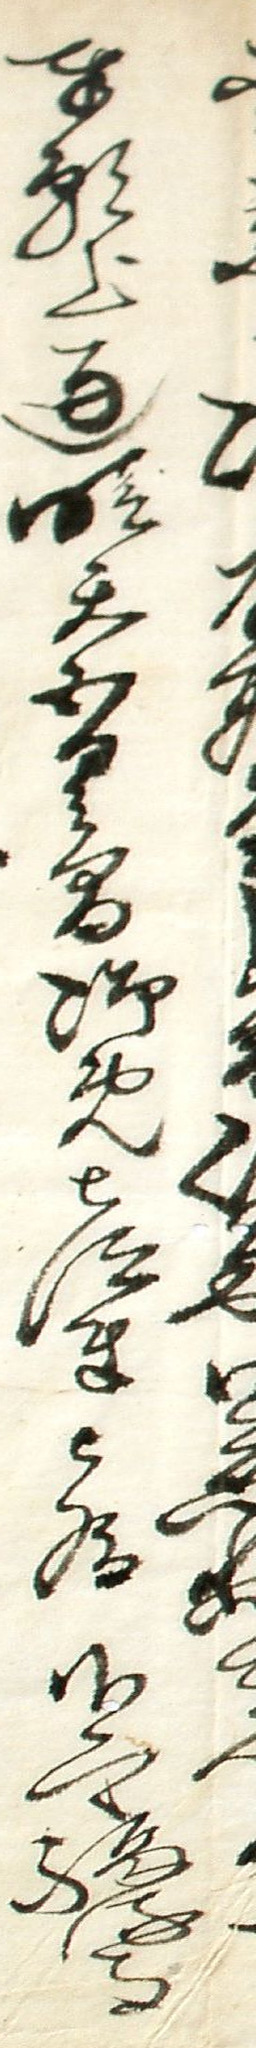奉願上通晴天五日之間御免被仰付被為下候ハヽ福満寺
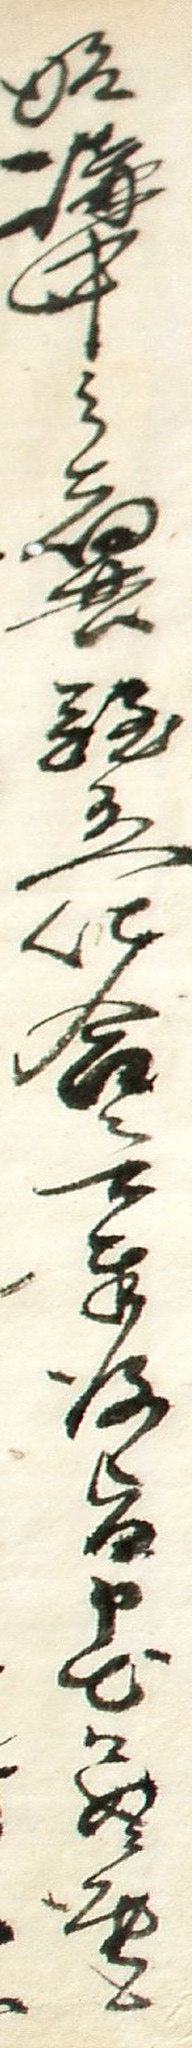始講中之者共難有仕合ニ可奉存旨申出候義ニ御坐候
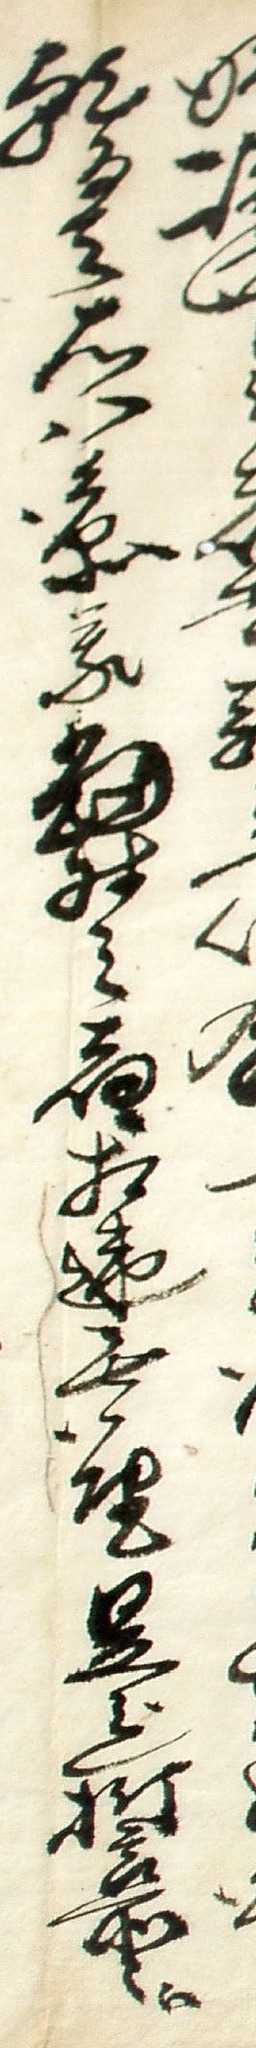就而者右八兵衛義當村之者ニ相違無御坐候是迄折節所々江
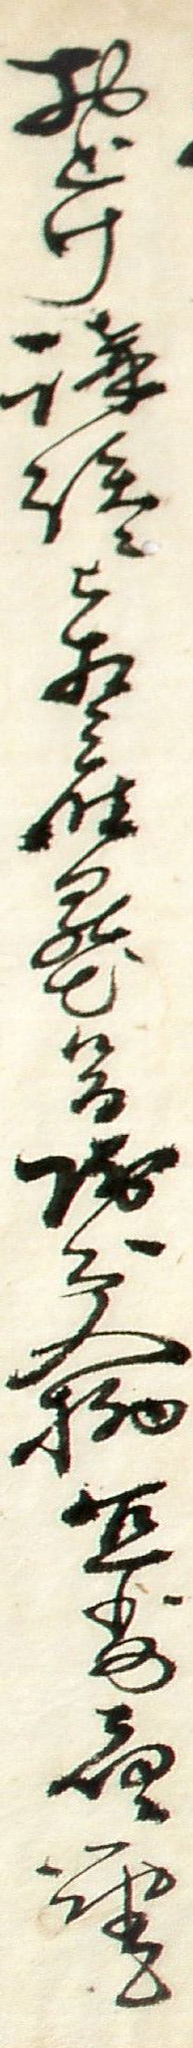おどけ講談ニ被相雇罷出候間随分人柄宜布者ニ御坐候

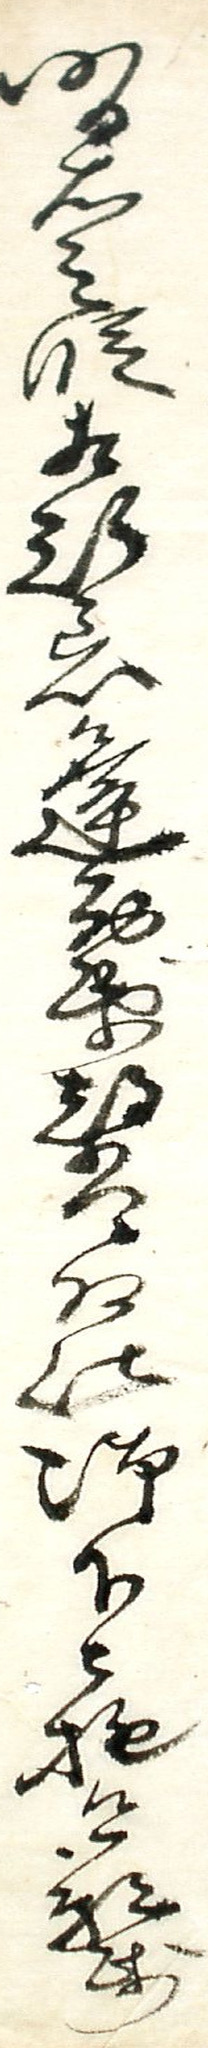仍而右之段相行着候運別帋都書ニ為仕御下被遊候御願帋
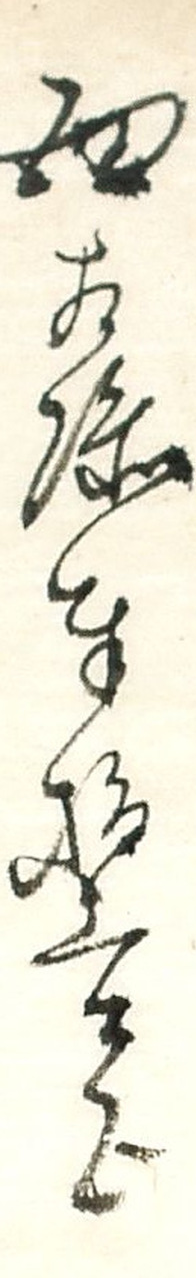面相添奉指上候以上
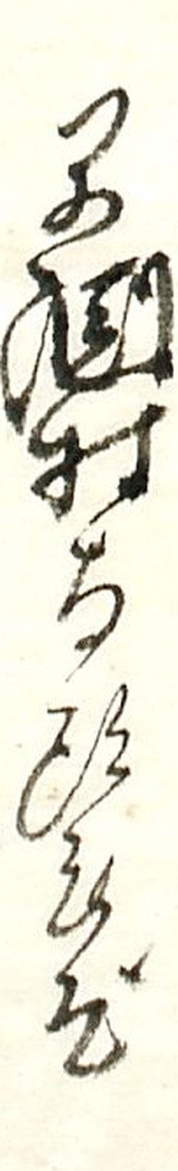早渕村与頭庄屋
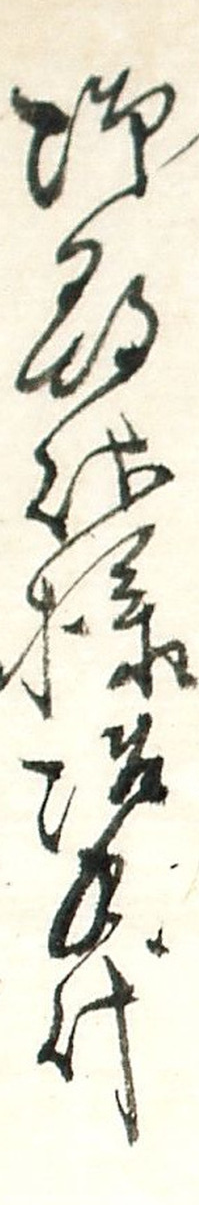御郡代様御手代
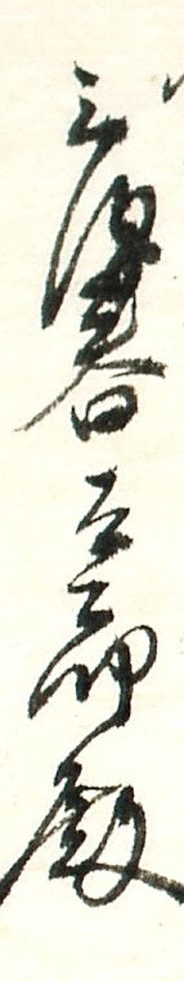三澤春太郎殿
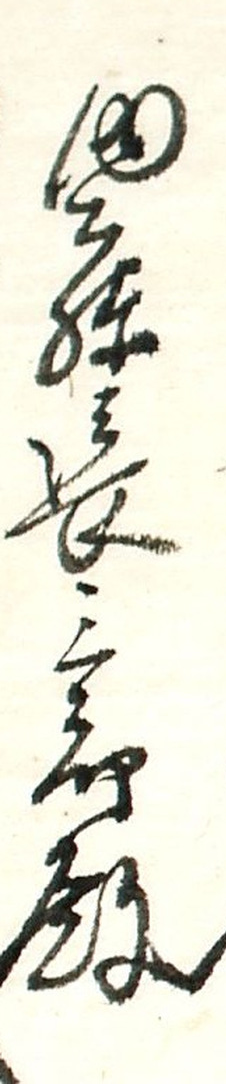内藤長三郎殿
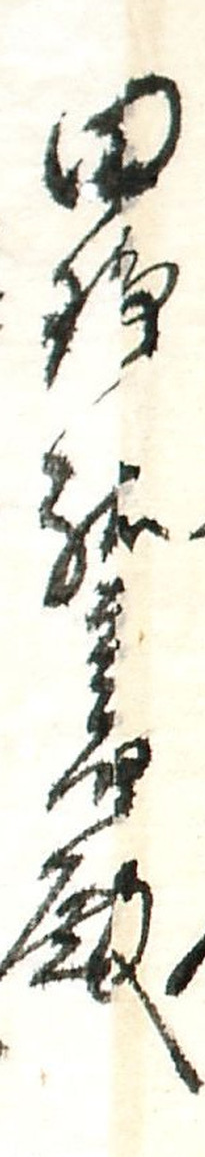田野祐太郎殿
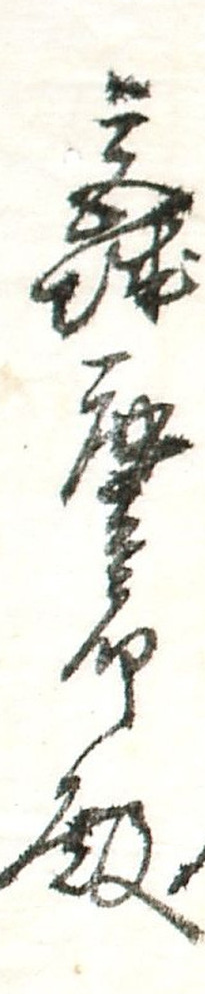宮城麻太郎殿

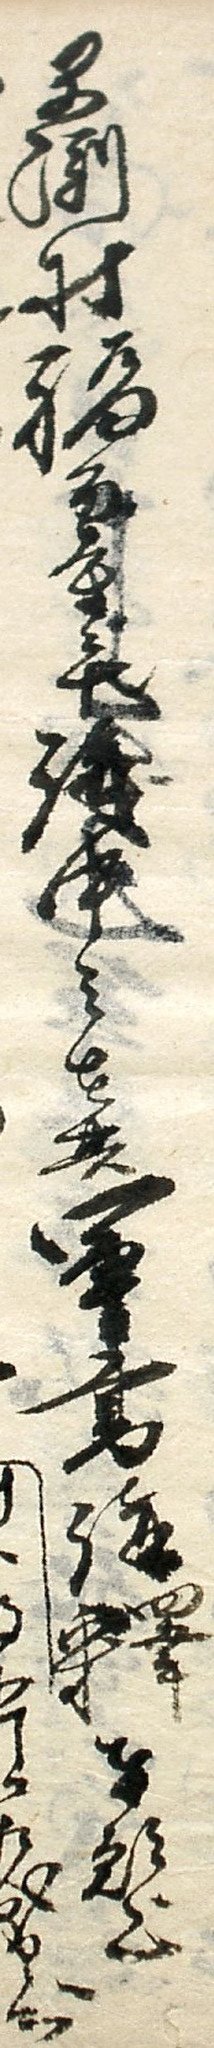早渕村福万寺幷講中之者共軍書講釋奉願上

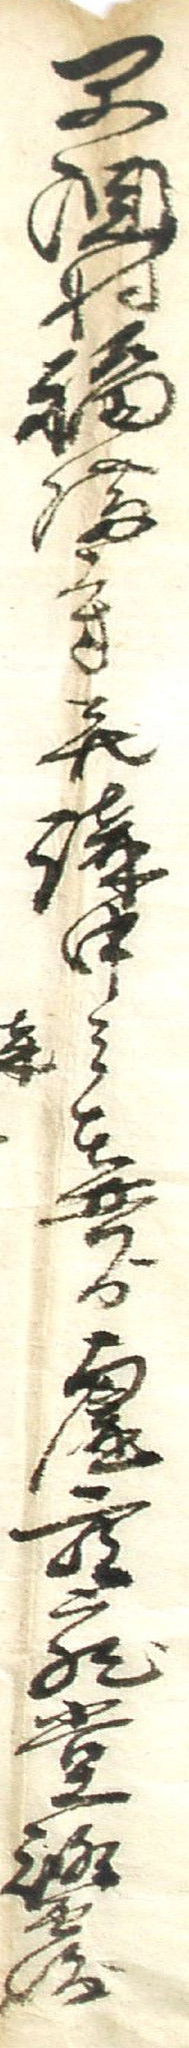早渕村福満寺幷講中之者共ゟ虚空蔵堂修覆
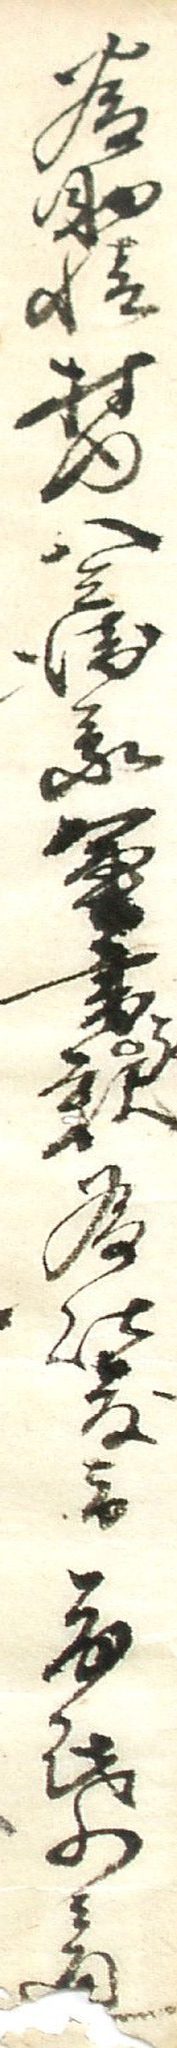為助情村内八兵衛義軍書○釈為仕度旨別帋之通
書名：（早渕村福満寺虚空蔵菩薩堂修復のためおどけ軍書講談願行着添え書控）
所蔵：鳴門教育大学 Naruto University of Education
